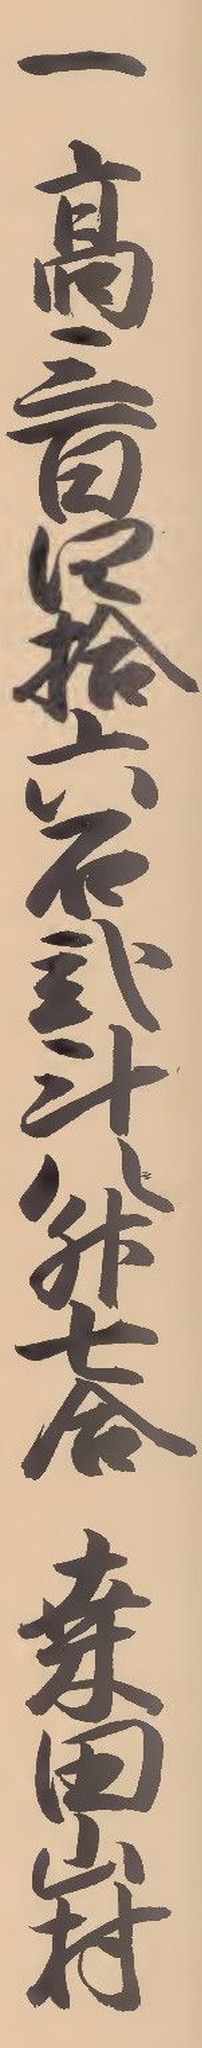一髙三百四拾六石弐斗八升七合桑田山村
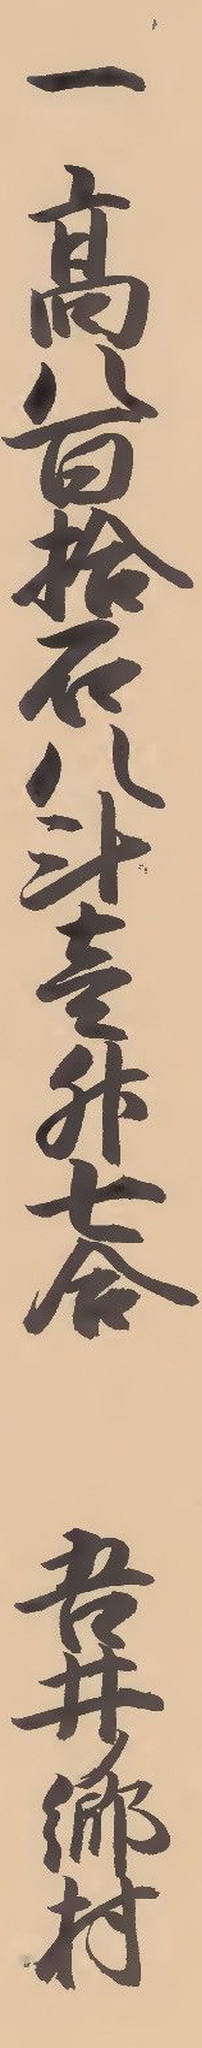一髙八百拾石八斗壱升七合吾井ノ郷村
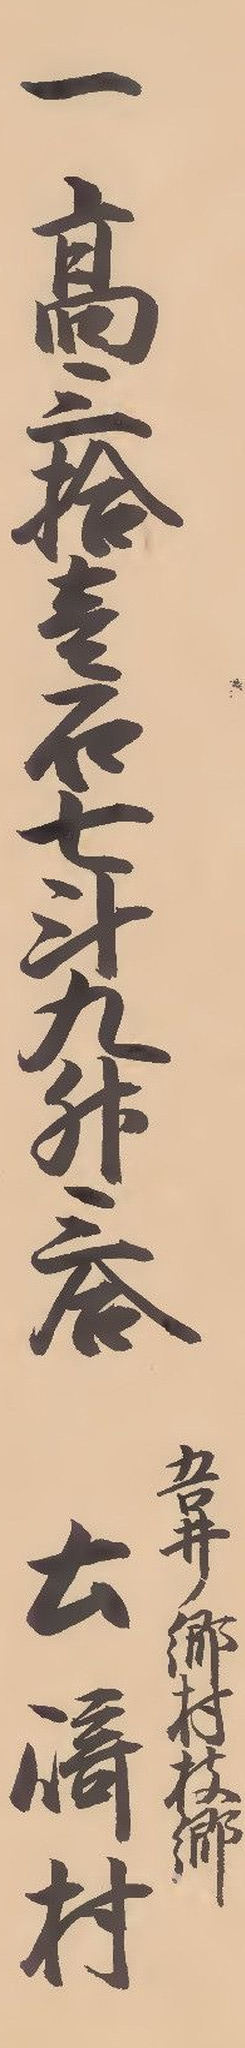一髙三拾壱石七斗九升三合土崎村
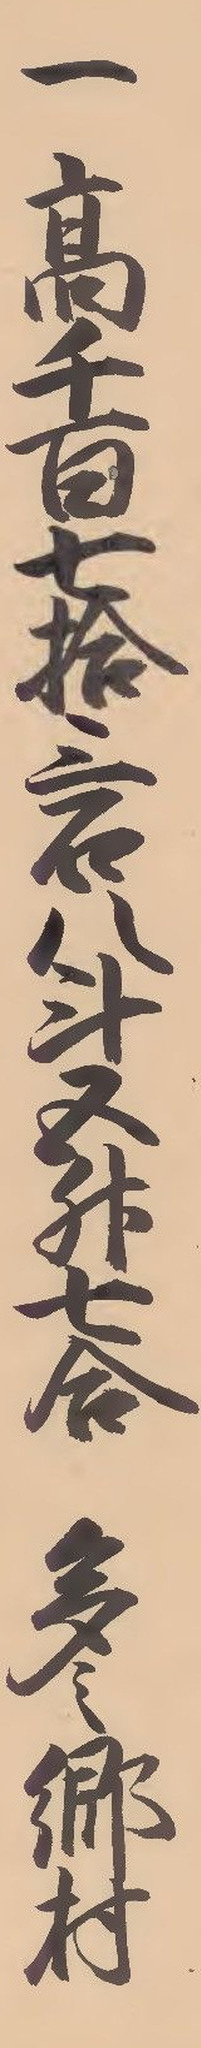一髙千百七拾三石八斗五升七合田之郷村

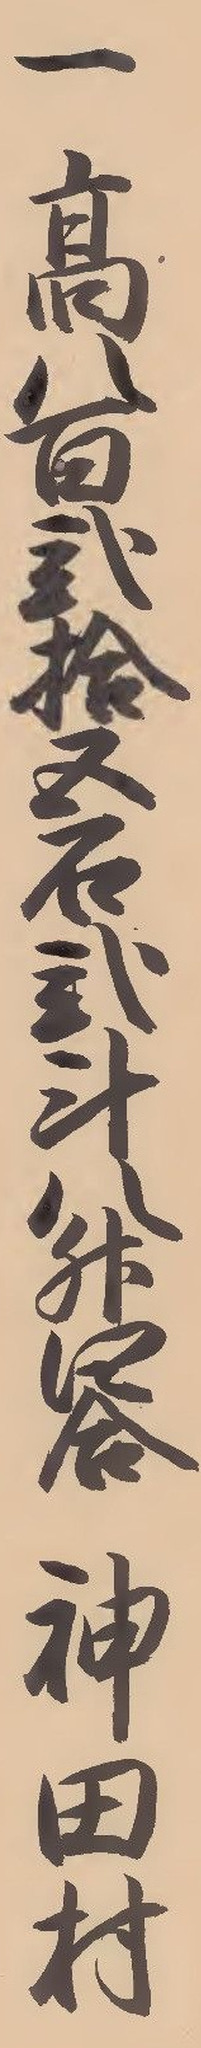一髙八百弐拾五石弐斗八升四合神田村
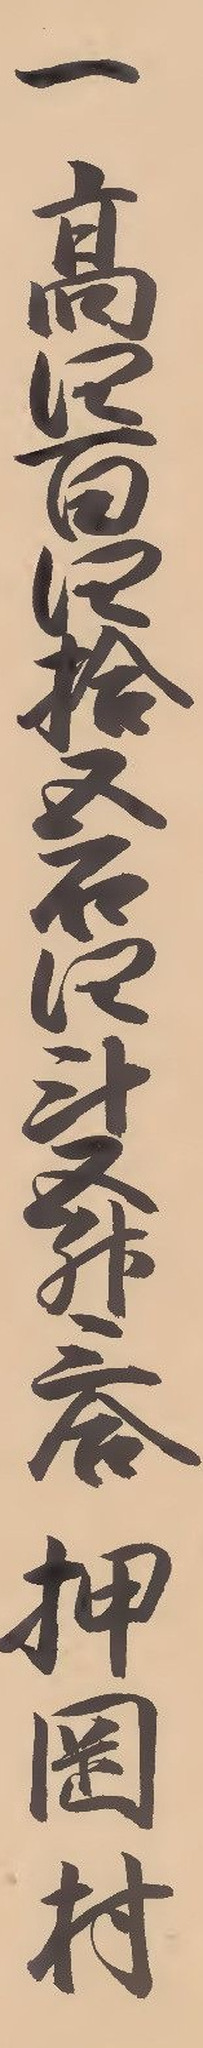一髙四百四拾五石四斗五升三合押岡村
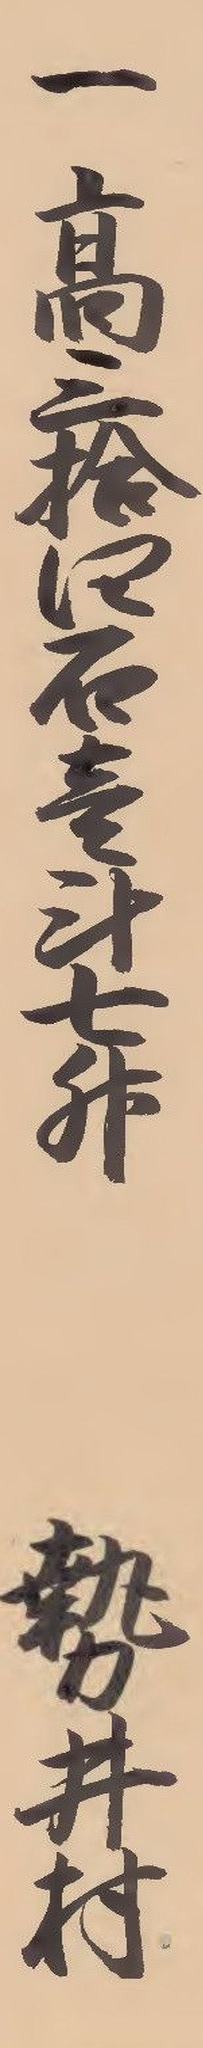一髙三拾四石壱斗七升勢井村
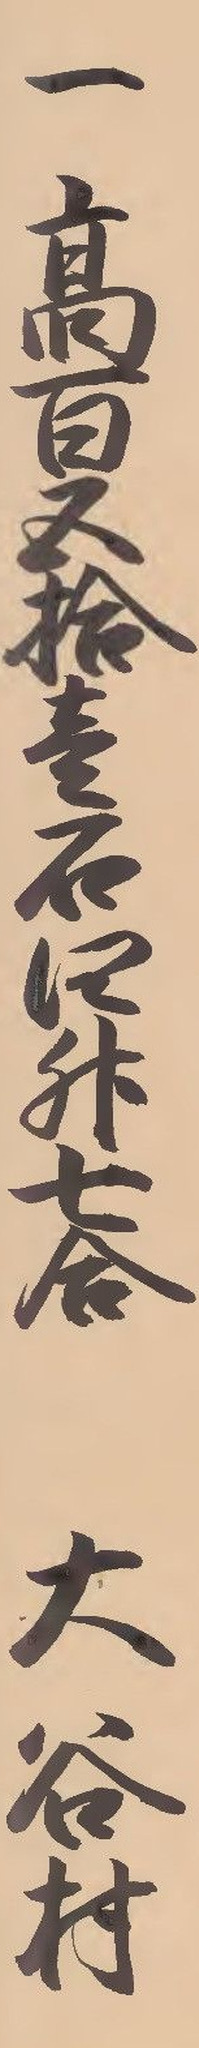一髙百五拾壱石四升七合大谷村
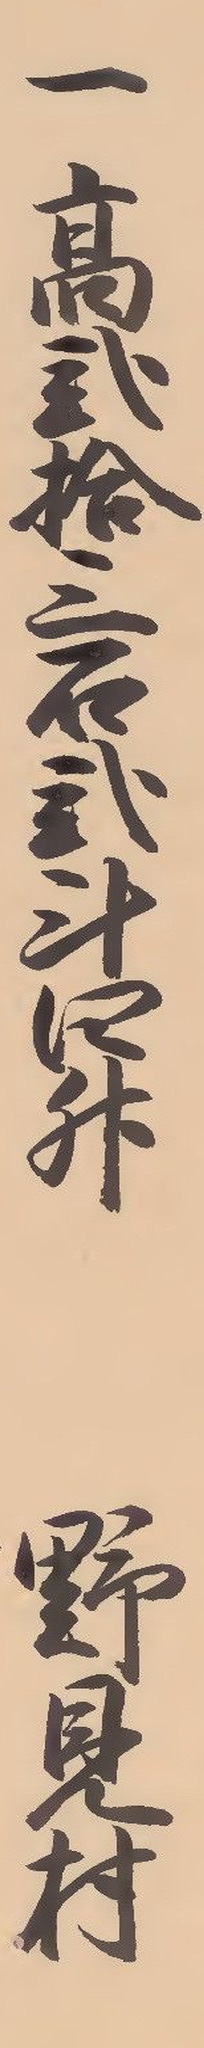一髙弐拾三石弐斗四升野見村
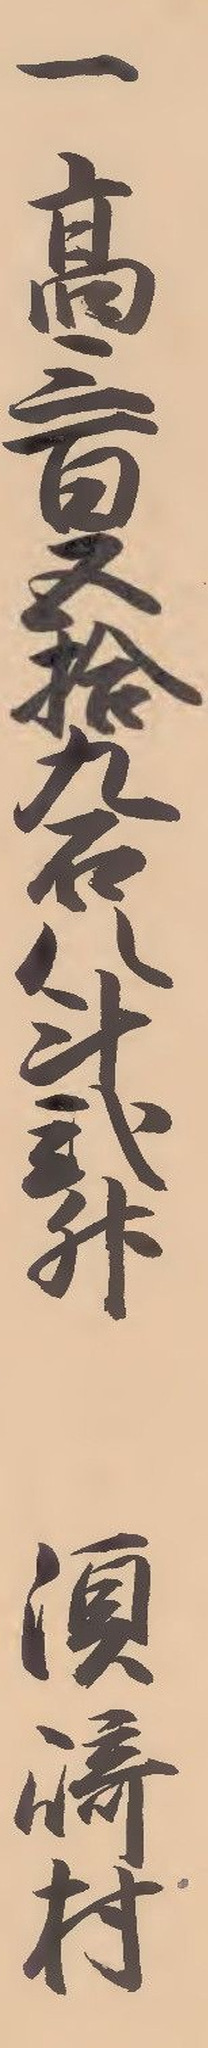一髙三百五拾九石八斗弐升須崎村
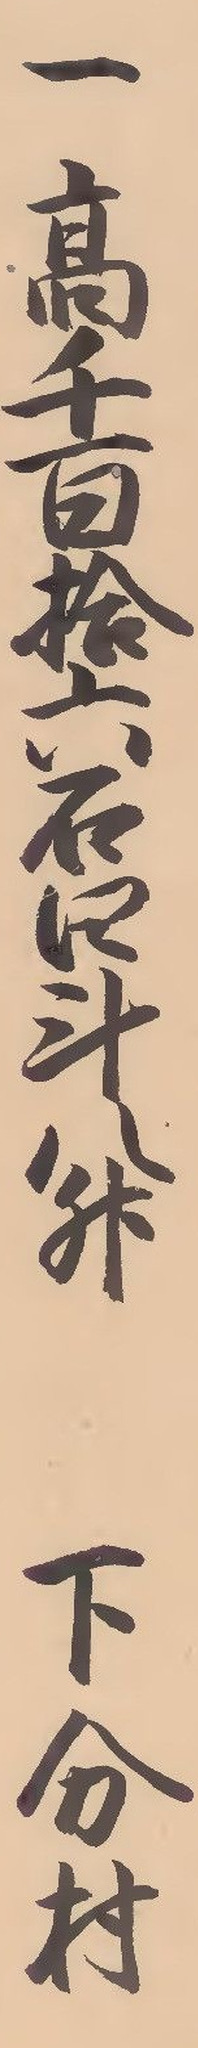一髙千百拾六石四斗八升下分村

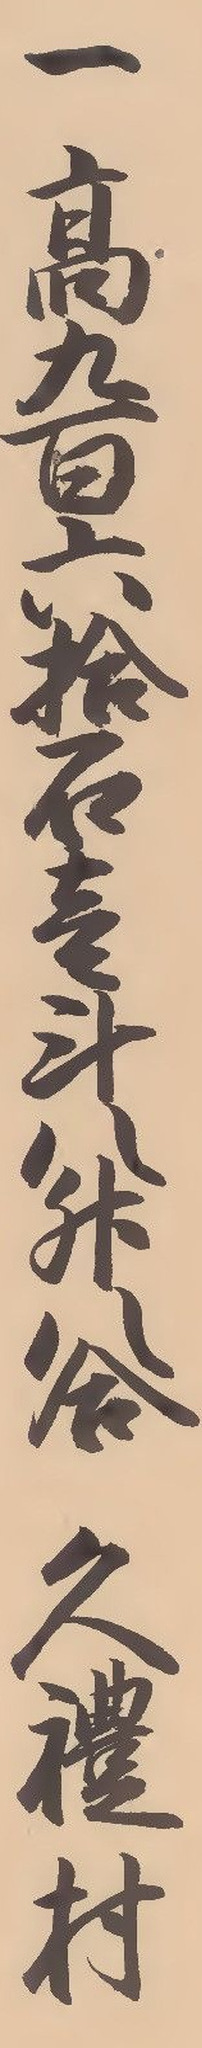一髙九百六拾石壱斗八升八合久禮村
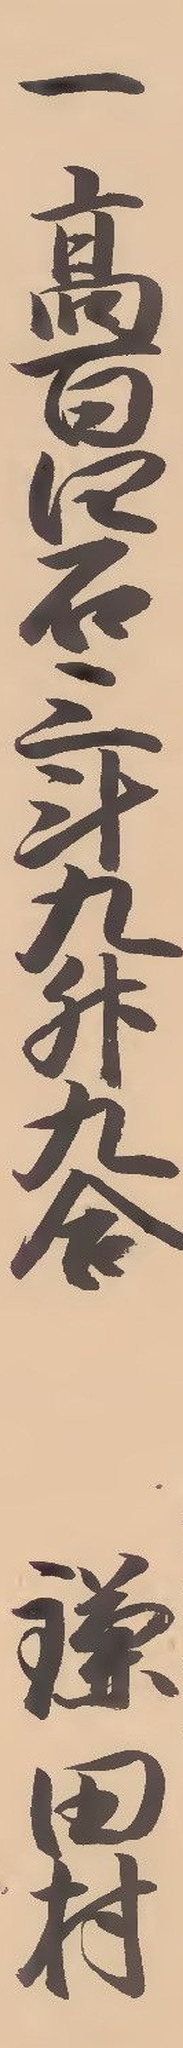一髙百四石三斗九升九合鎌田村
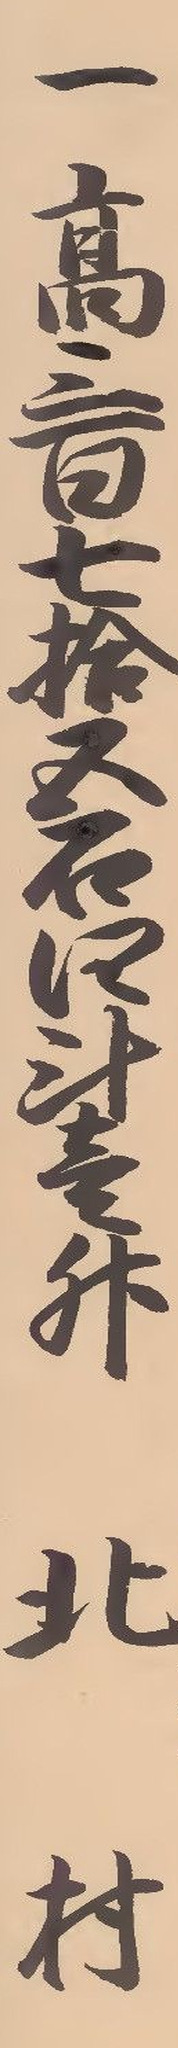一髙三百七拾五石四斗壱升北村
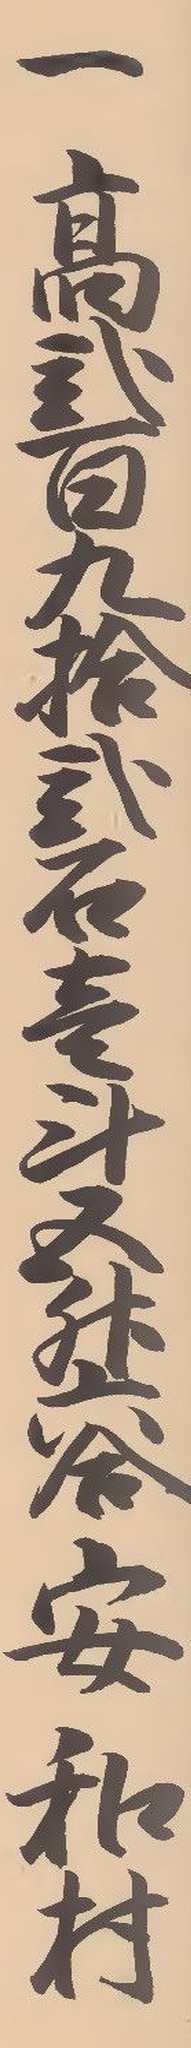一髙弐百九拾弐石壱斗五升六合安和村
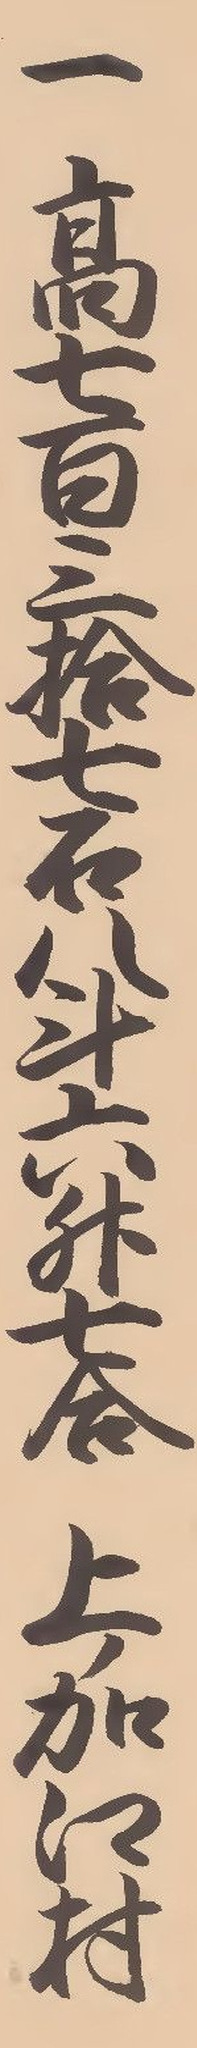一髙七百三拾七石八斗六升七合上ノ加江村
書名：土佐国郷帳
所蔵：国立公文書館 National Archives of Japan
